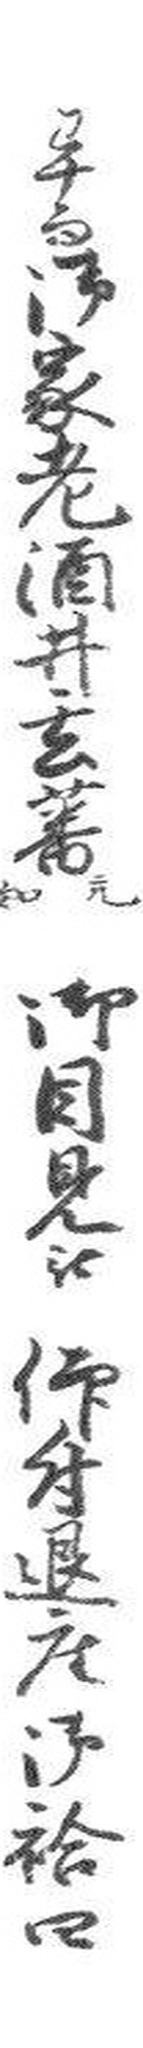畢而御家老酒井玄蕃元知御目見被仰付退座御袷四
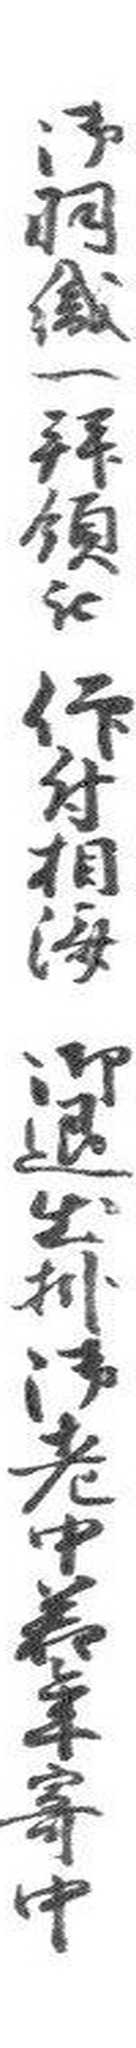御羽織一拝領被仰付相済御退出掛御老中若年寄中
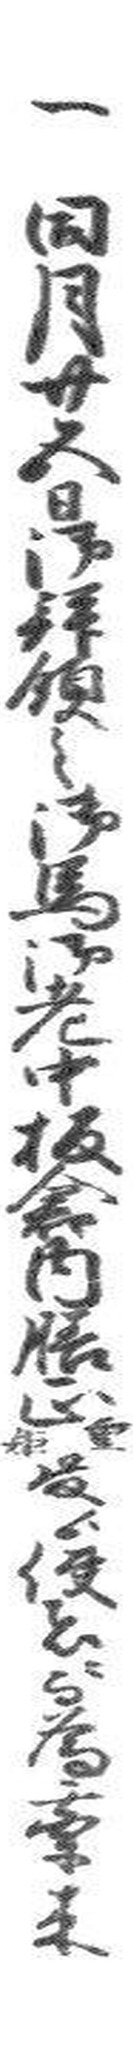一同月廿五日御拝領之御馬御老中板倉内膳正重矩殿ゟ使者ニ而為牽来
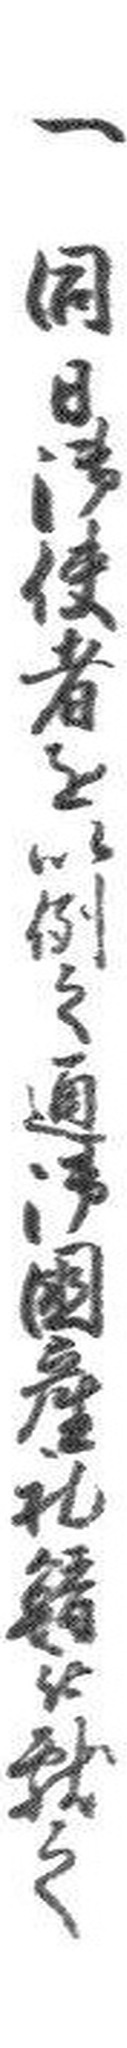一同日御使者を以例之通御国産初鯖被献之
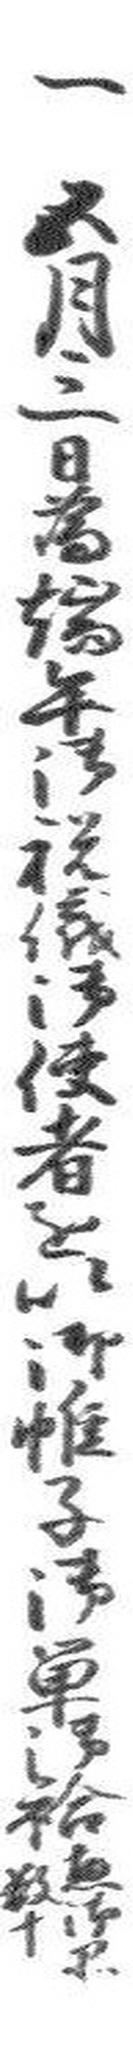一五月三日為端午御祝儀御使者を以御帷子御単御袷惣御品数十
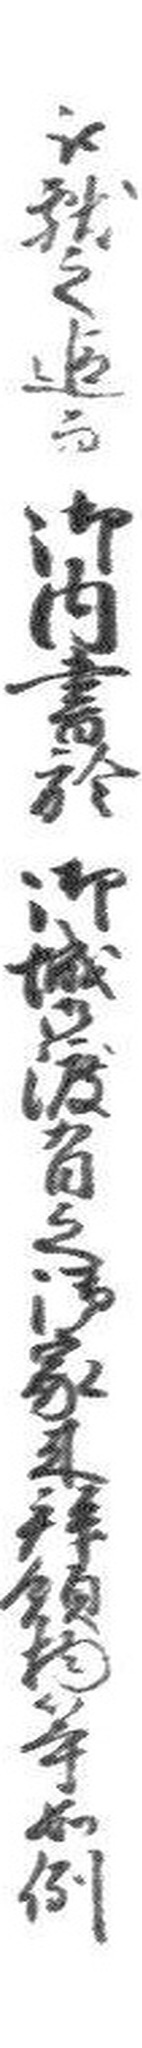被献之追而御内書於御城御渡有之御家来拝領物等如例
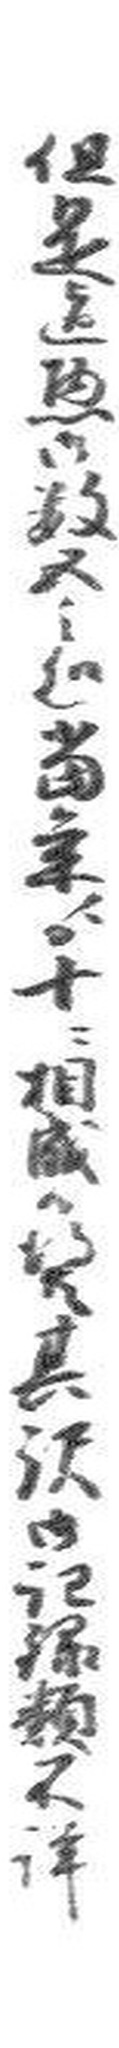但是迄惣御数五之処当年ゟ十ニ相成候得共其訳御記録類不詳
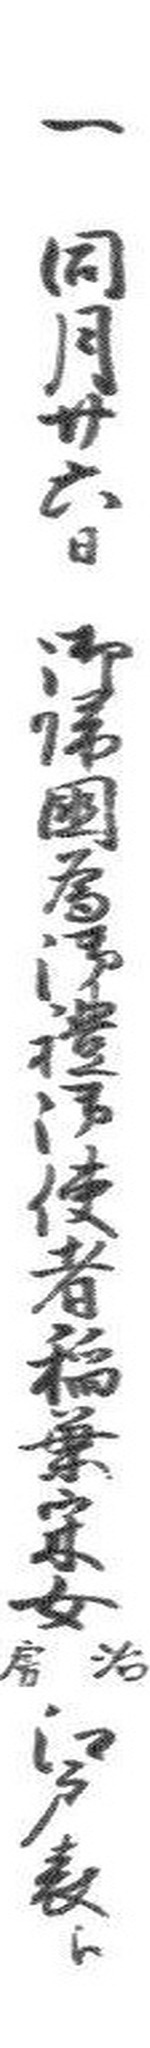一同月廿六日御帰国為御礼御使者稲葉采女治房江戸表江
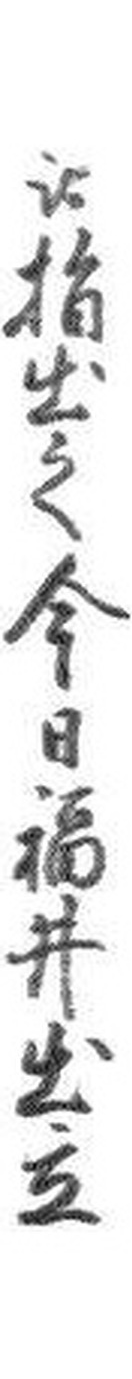被指出之今日福井出立
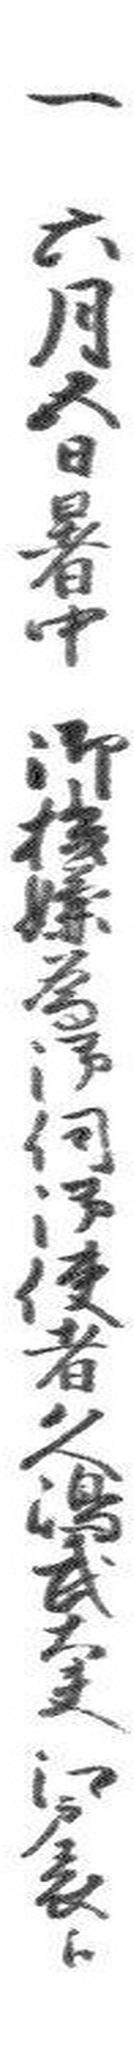一六月五日暑中御機嫌為御伺御使者久嶋武大夫江戸表江

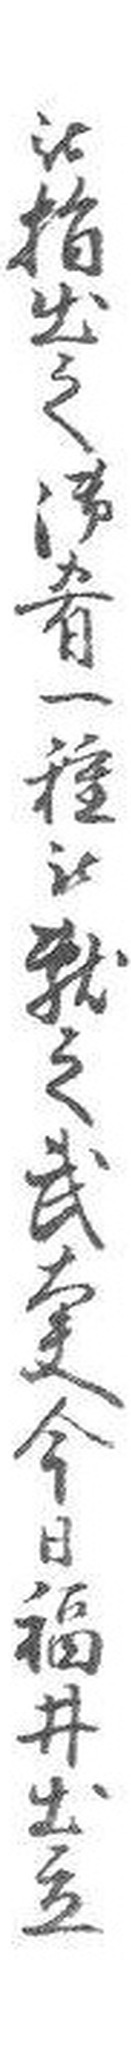被指出之御肴一種被献之武大夫今日福井出立
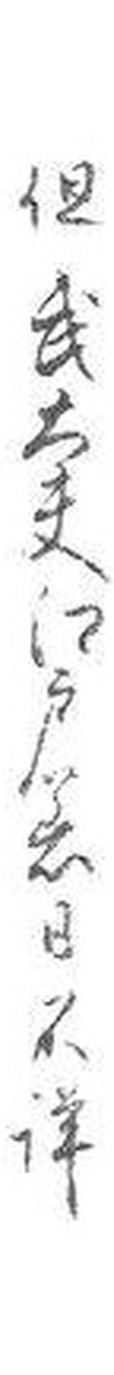但武大夫江戸着日不詳
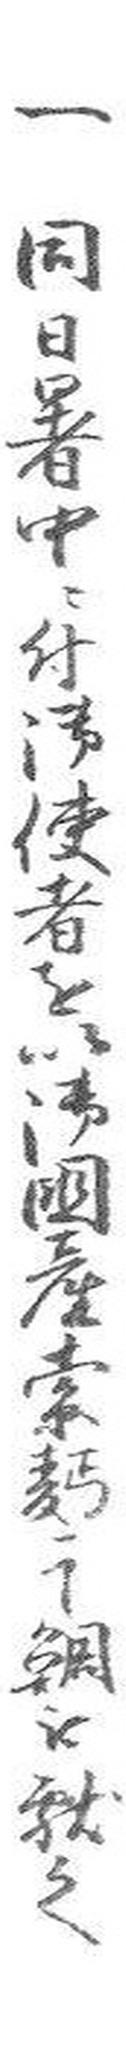一同日暑中ニ付御使者を以御国産索麪干鯛被献之
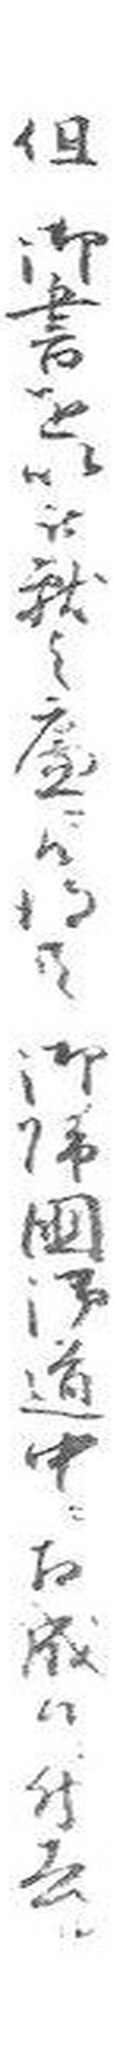但御書を以被献之廉ニ候得共御帰国御道中ニ相成候ニ付去ル
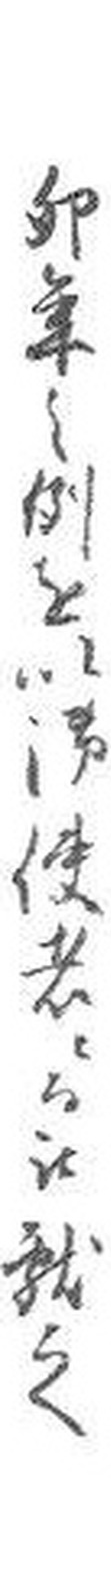卯年之例を以御使者ニ而被献之
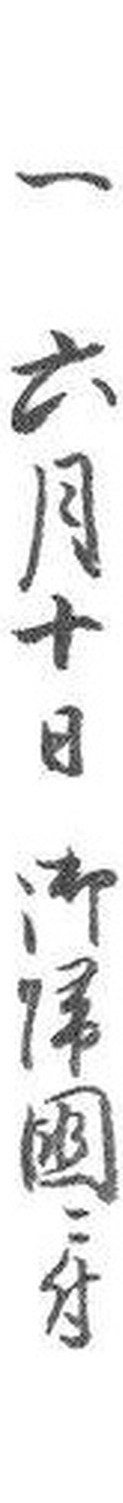一六月十日御帰国ニ付
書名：家譜 七 光通公 従寛文四年到同九年
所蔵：福井県文書館 Fukui Prefectural Archives
